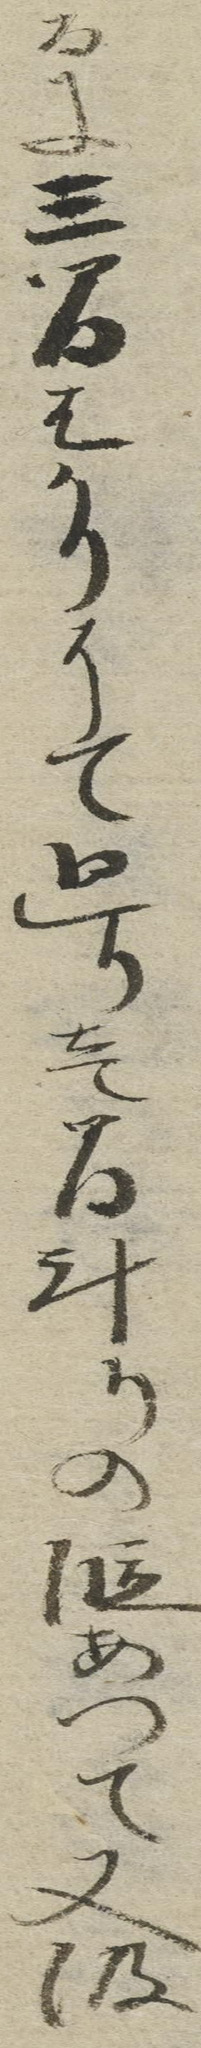るに三間はかりにて廻り壱間計りの段あつて又汲
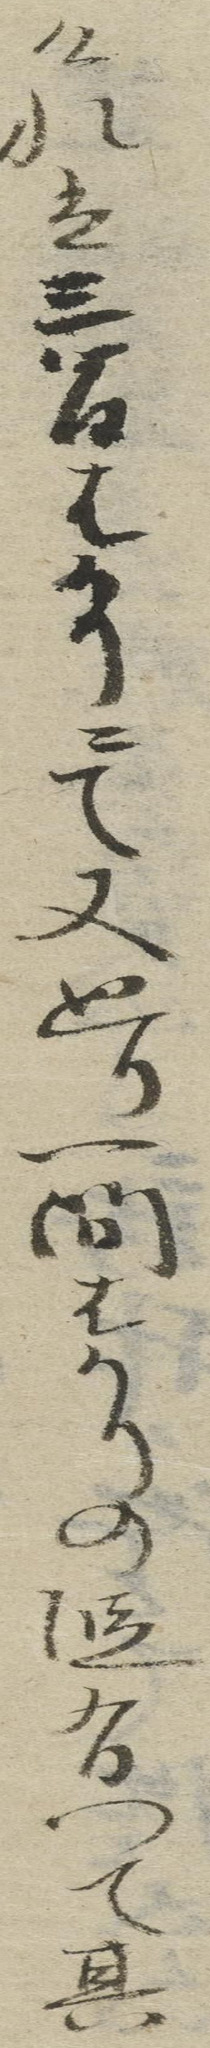けれは三間はかりニて又廻り一間はかりの段有つて其
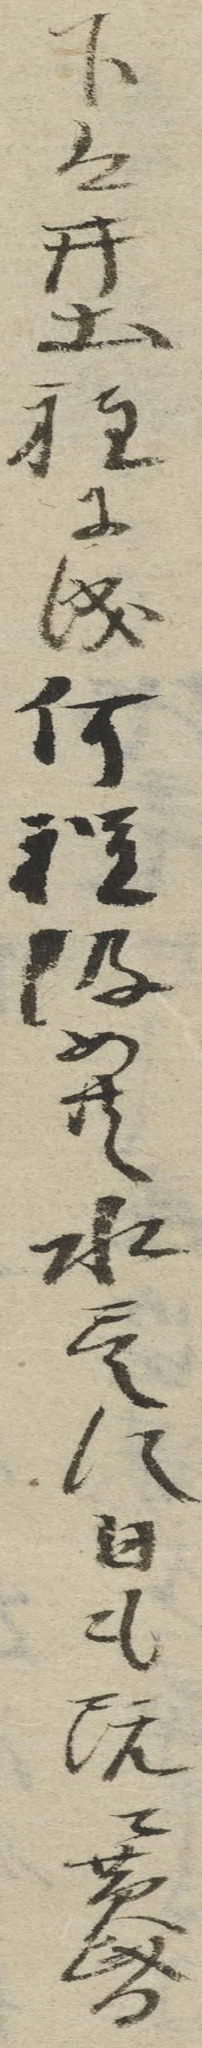下は井出程に成何程汲め共水尽す日も既ニ黄昏
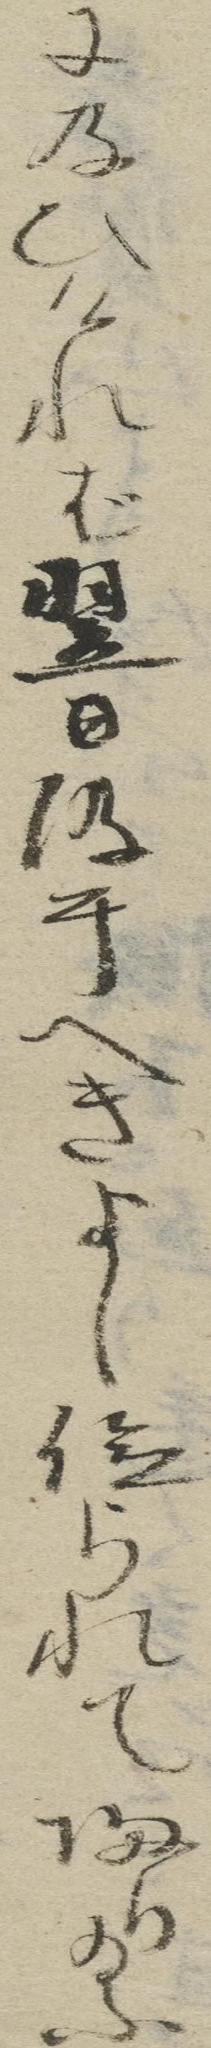に及ひければ翌日汲干へきよし仰られて帰り給ふ
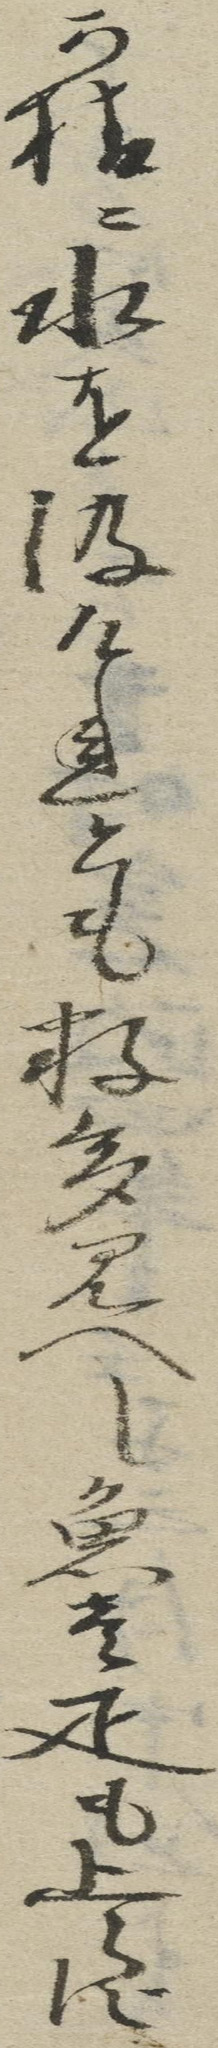可様ニ水を汲けれとも数多見へし魚壱疋も上らす
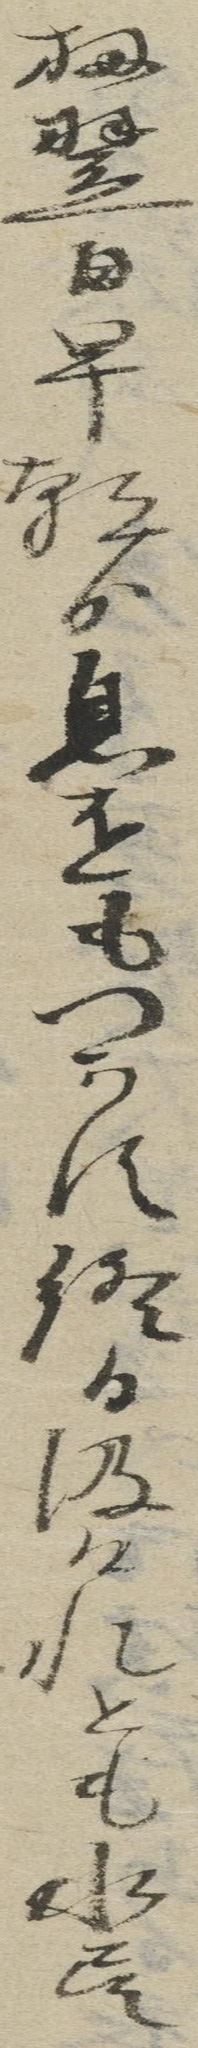扨翌日早朝ゟ息をもつかす終日汲けれとも水尽
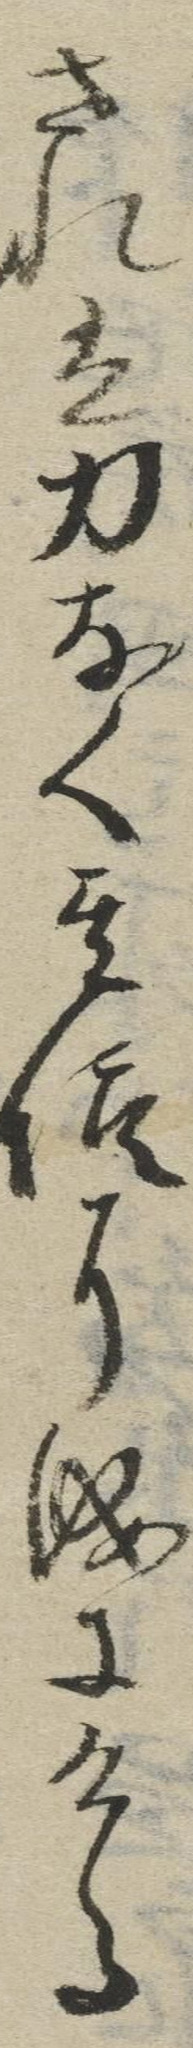されは力なく其侭に成にける
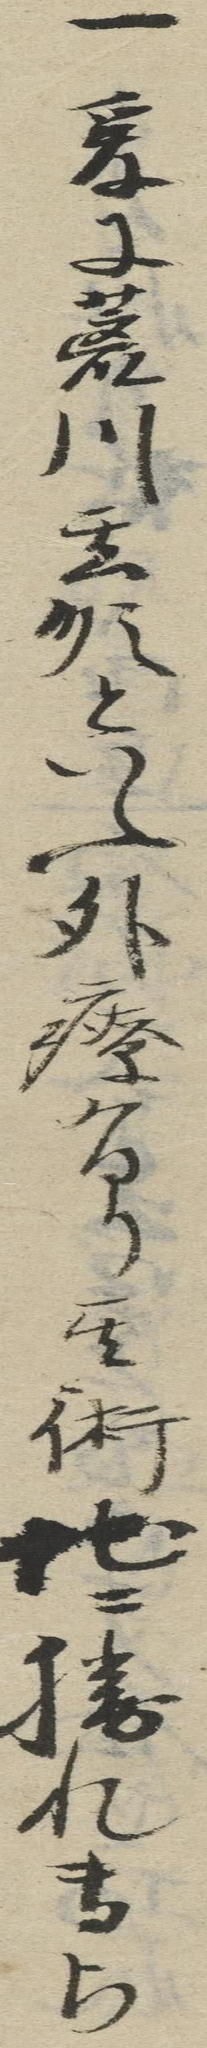一爰に荒川玄順といふ外療有り其術他に勝れ専ら
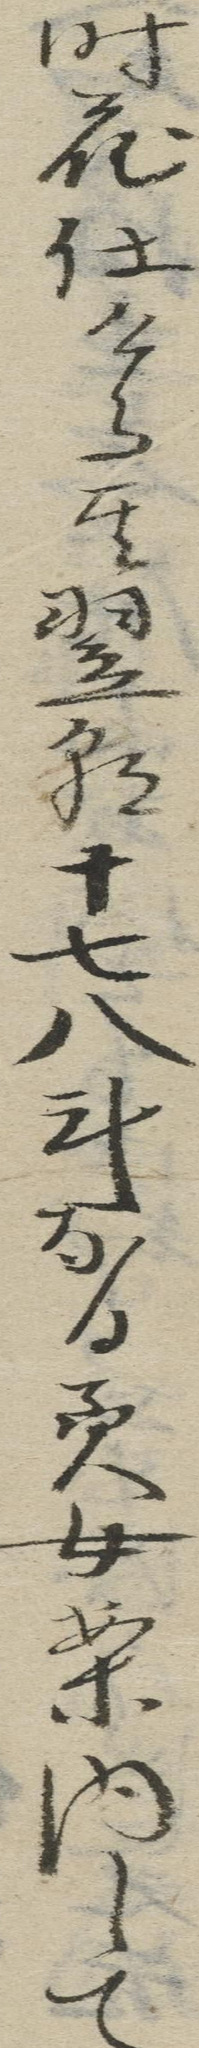時花仕ける其翌朝十七八計なる美女案内して
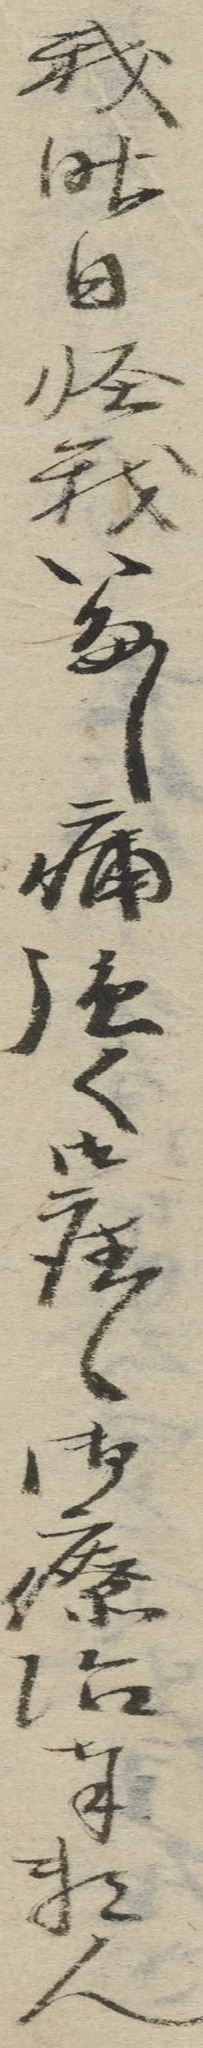我昨日怪我いたし痛強く御座候御療治奉頼ん
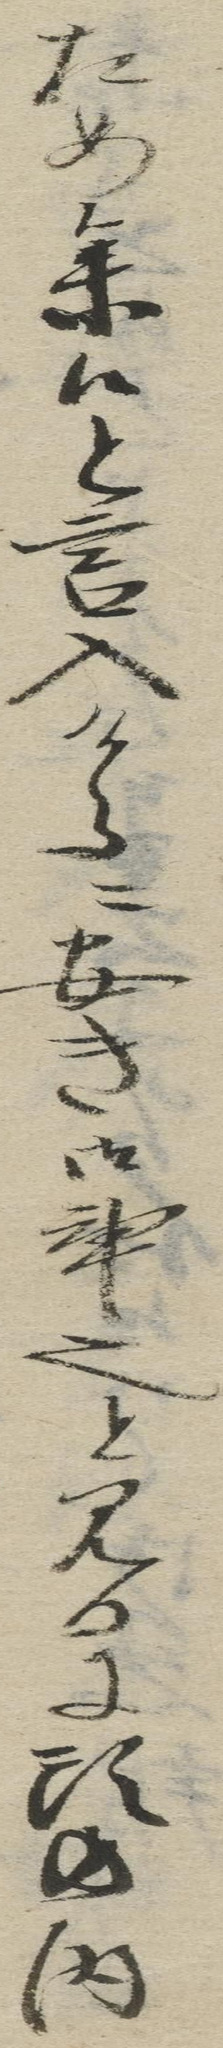ため参候と言入けるニ安き御事也と見るに頭の内
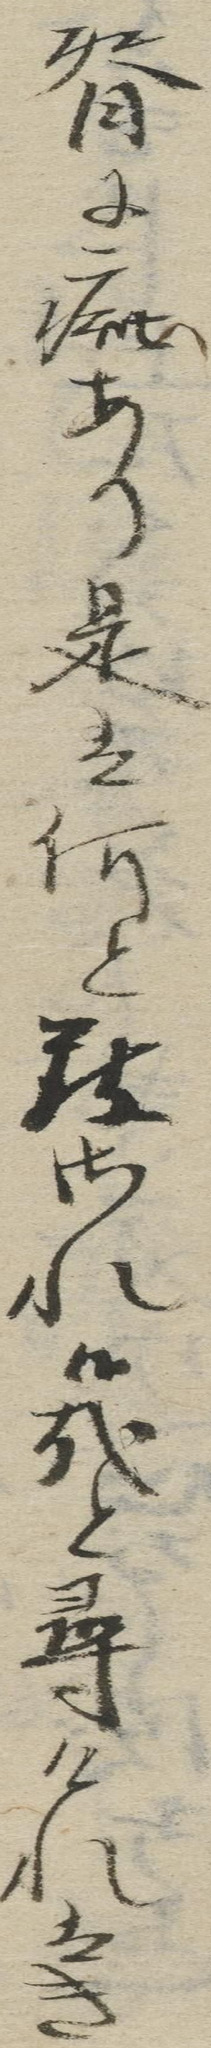背に疵あり是は何と致され候哉と尋けれはき
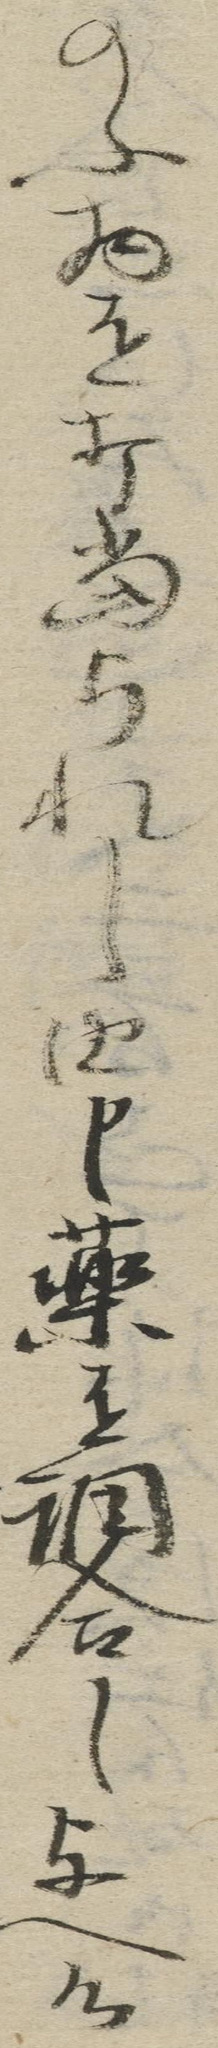のふ物を打当られ候由申薬を調合し与へけ
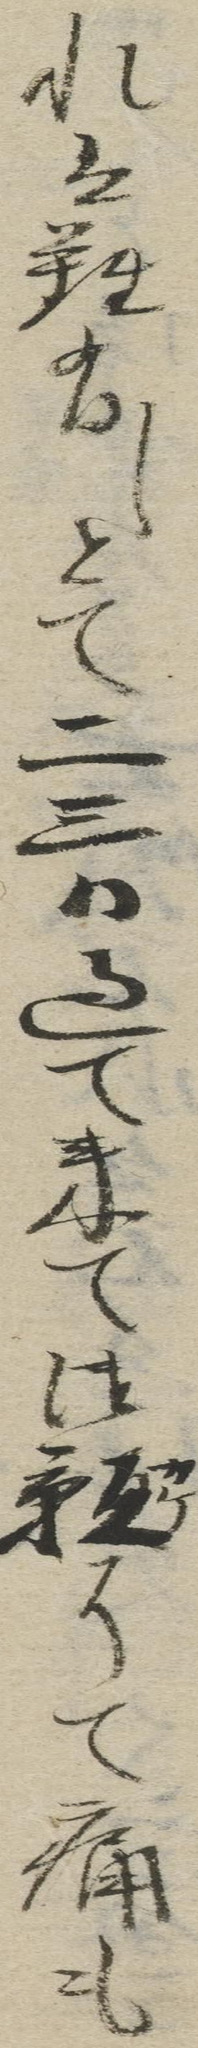れは難有しとてニ三日過て来て御頼にて痛も
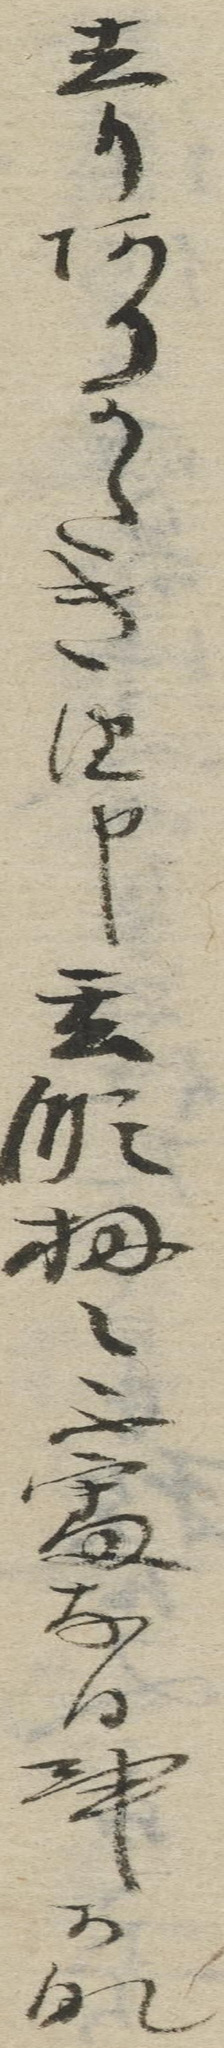去りありかたき由申玄順扨々不審なる事かな
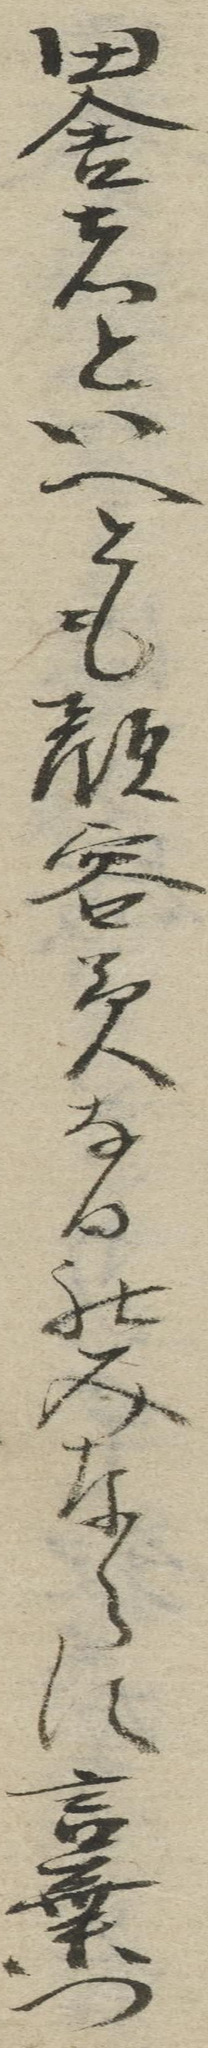田舎者といへとも顔容美なるのみならす言葉つ
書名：肥前國島原領普賢山大変記　完
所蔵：東京大学地震研究所図書室 Earthquake Research Institute Library, The University of Tokyo, JAPAN
